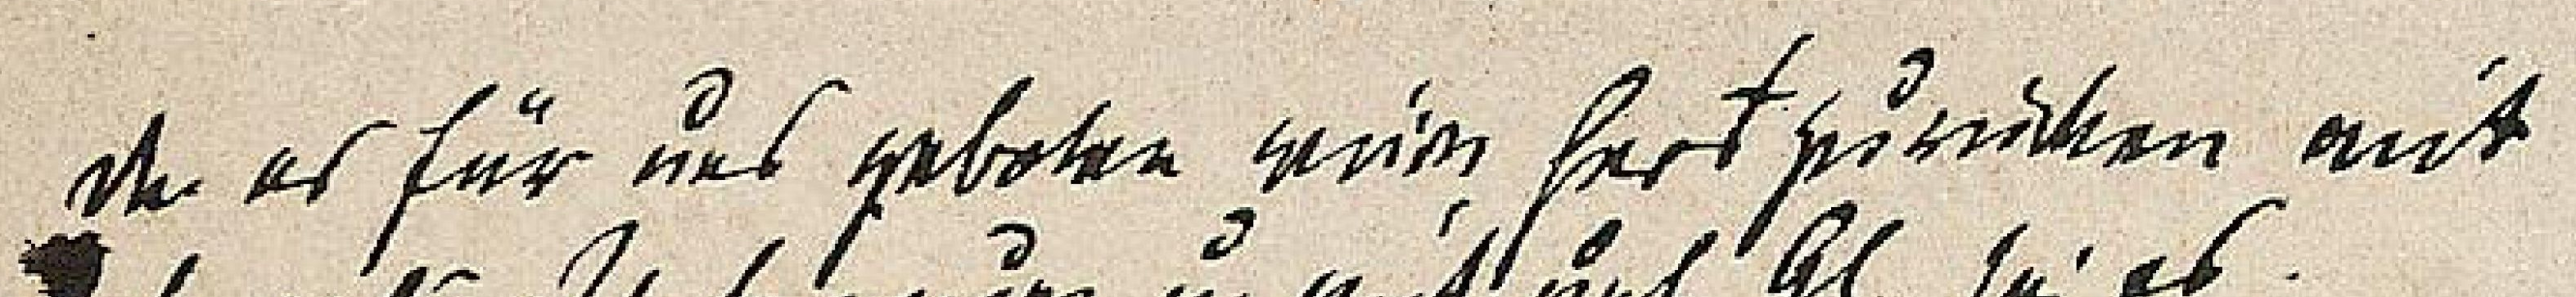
die es für uns geboten wäre herstzrücken mit
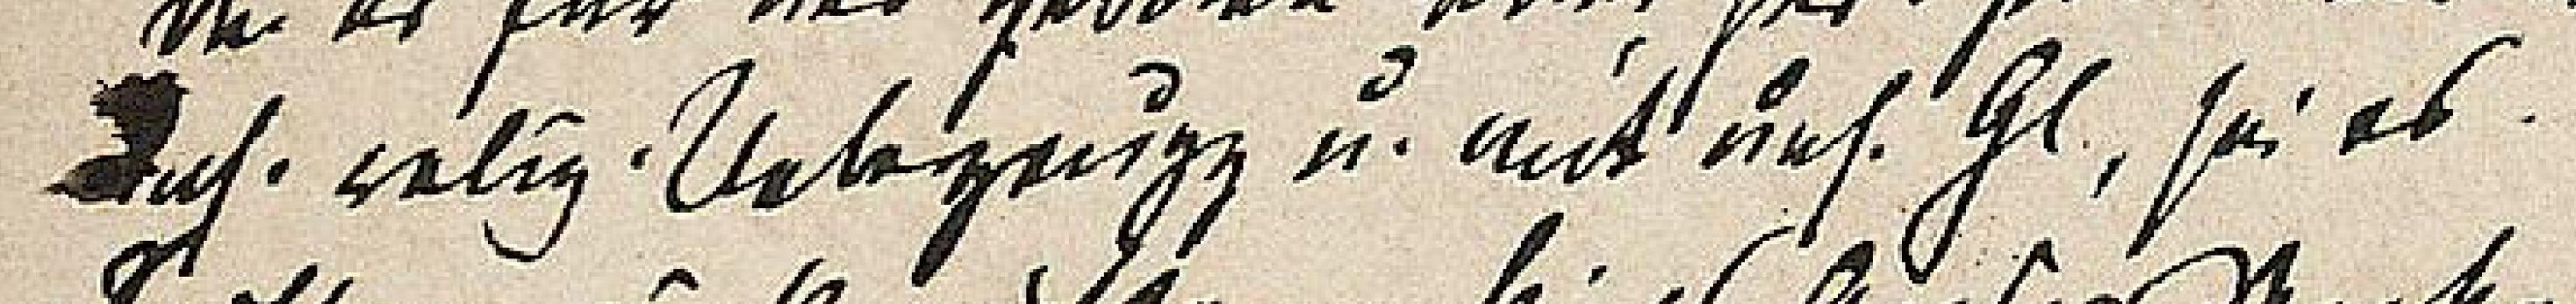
Jes. relig Ueberzeugg u. mit uns. Gl, sei es.
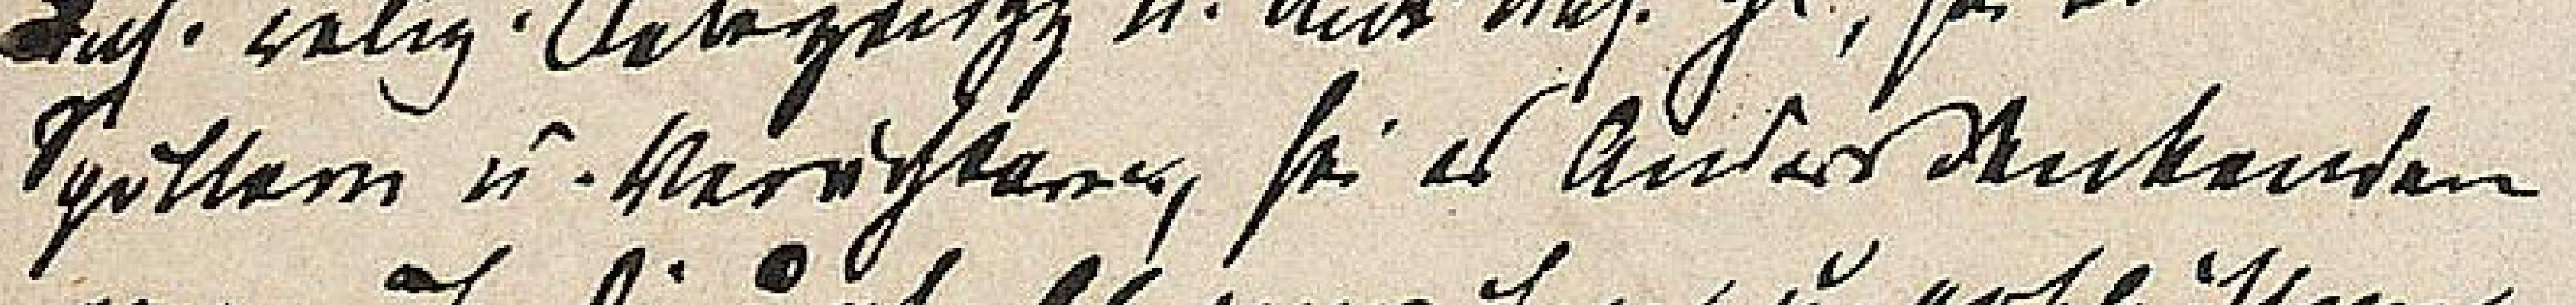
Spöttern u. Verächtern, sei es andersdenkenden
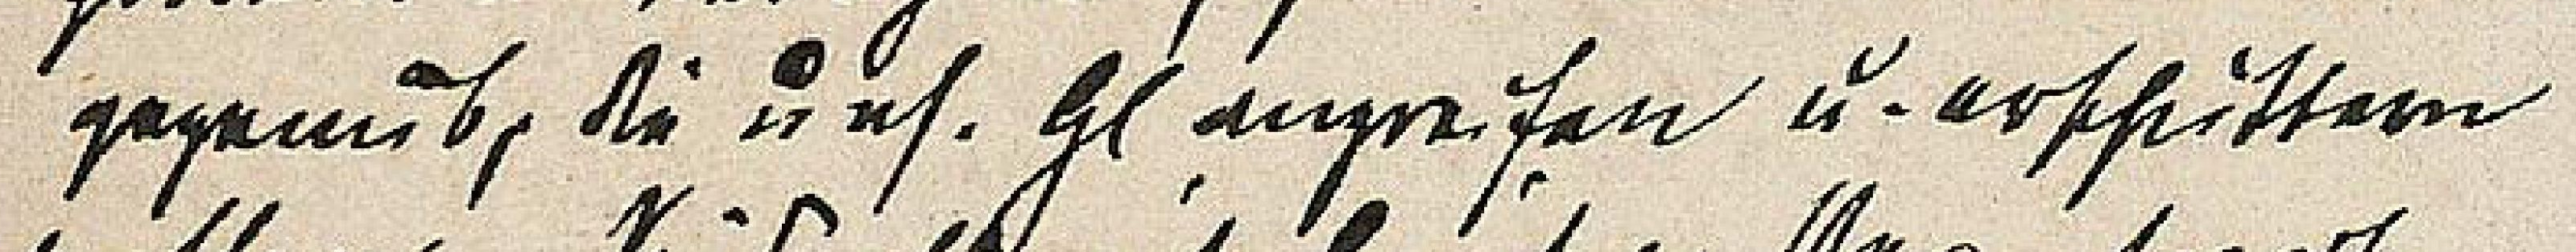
gegenüb, die uns. Gl. angreifen u. erschüttern
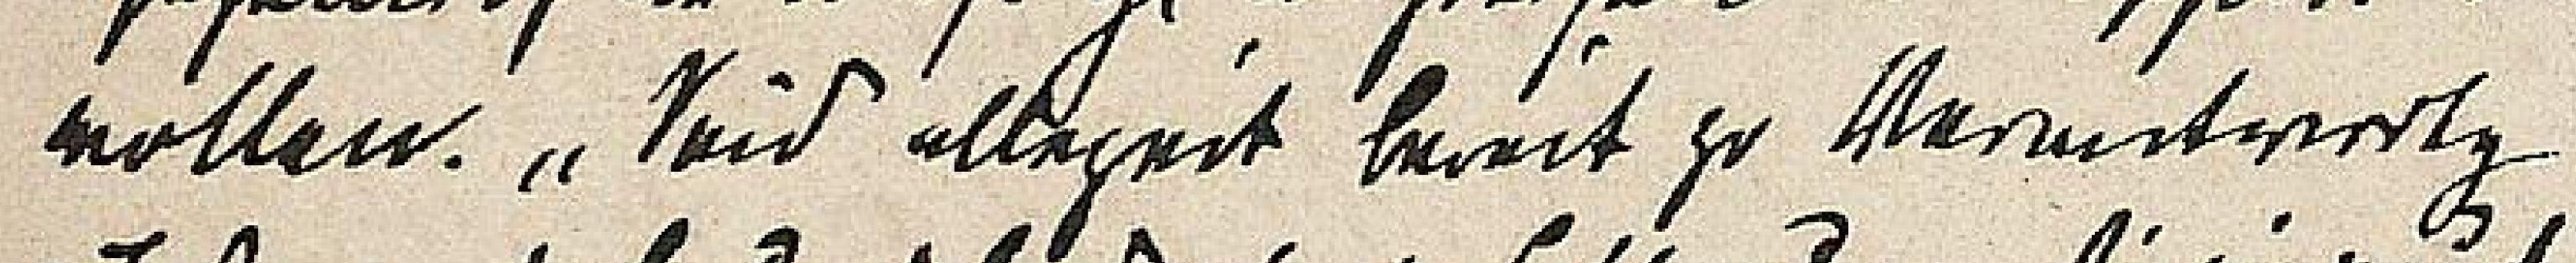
wollen. "Seid allzeit bereit zu Verantwortg
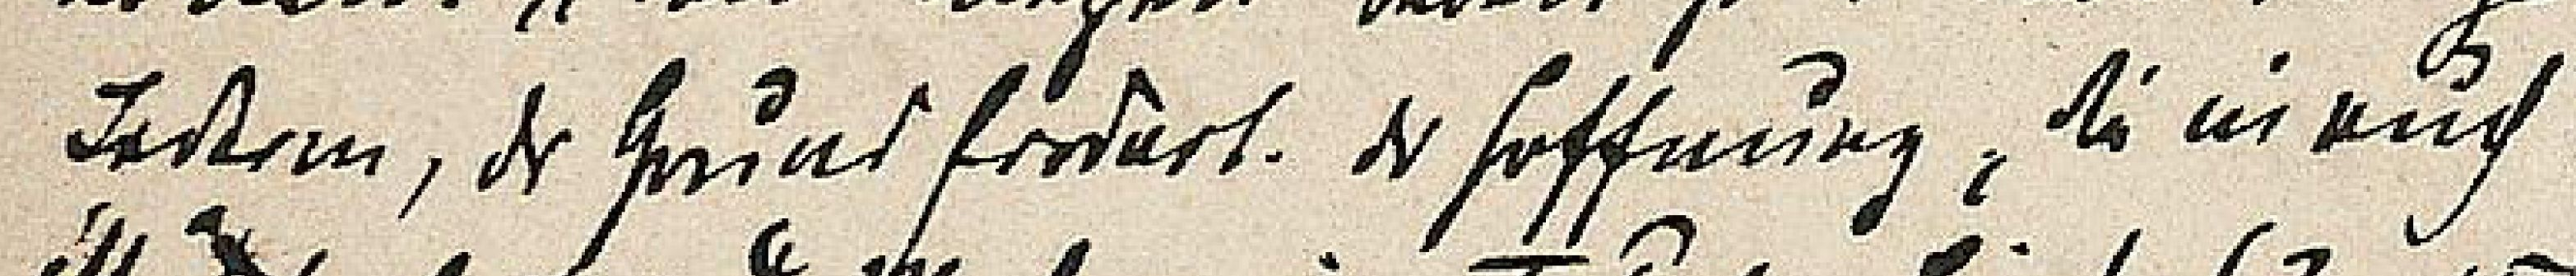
Jedem, der Grund fordert. d. Hoffnung, die euch
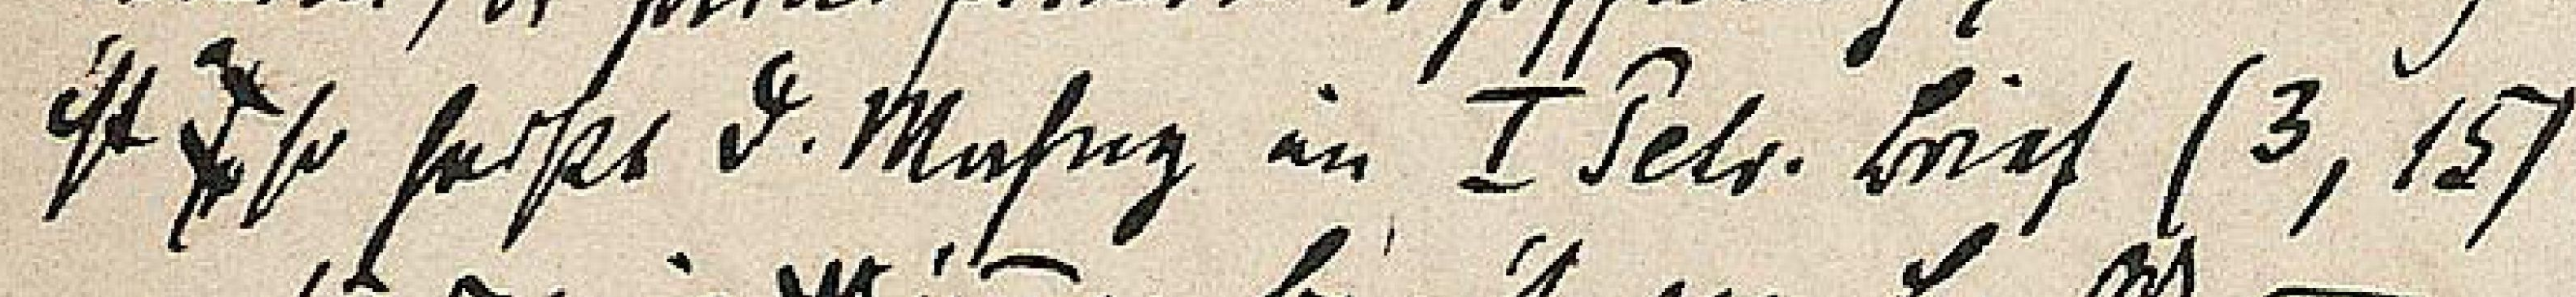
ist so so heißt d. Mahng in I Petr. Brief (3, 15)
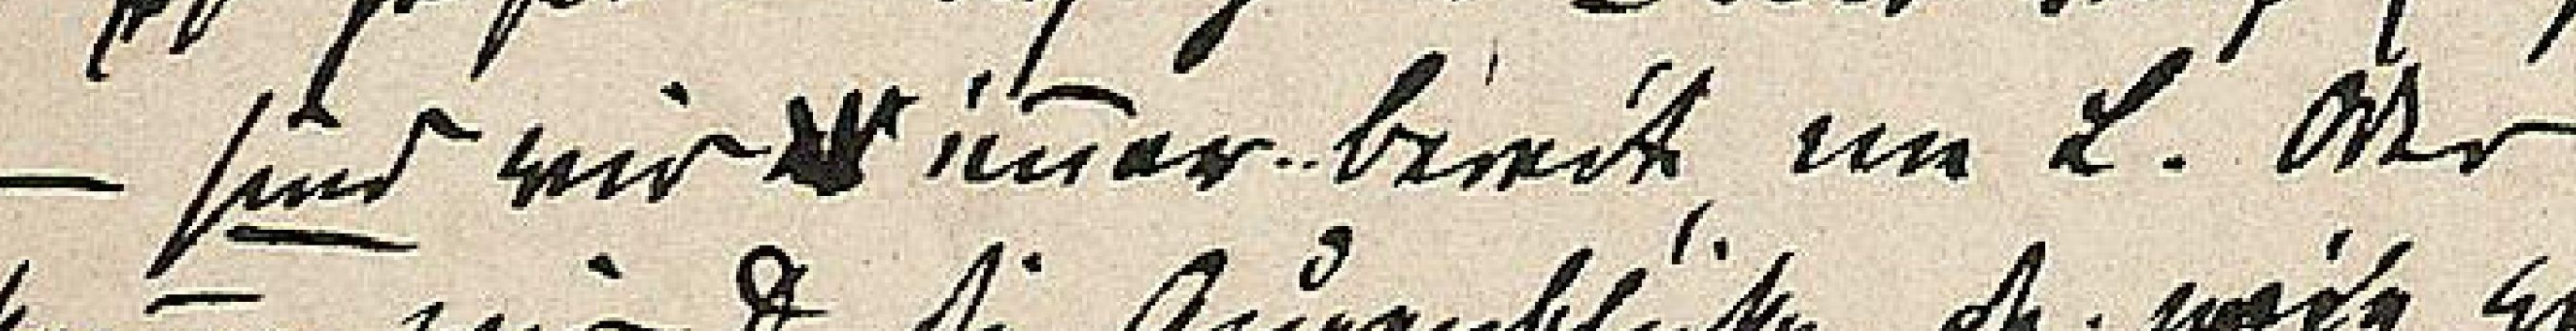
- sind wir es immer bereit, mn L., Oder
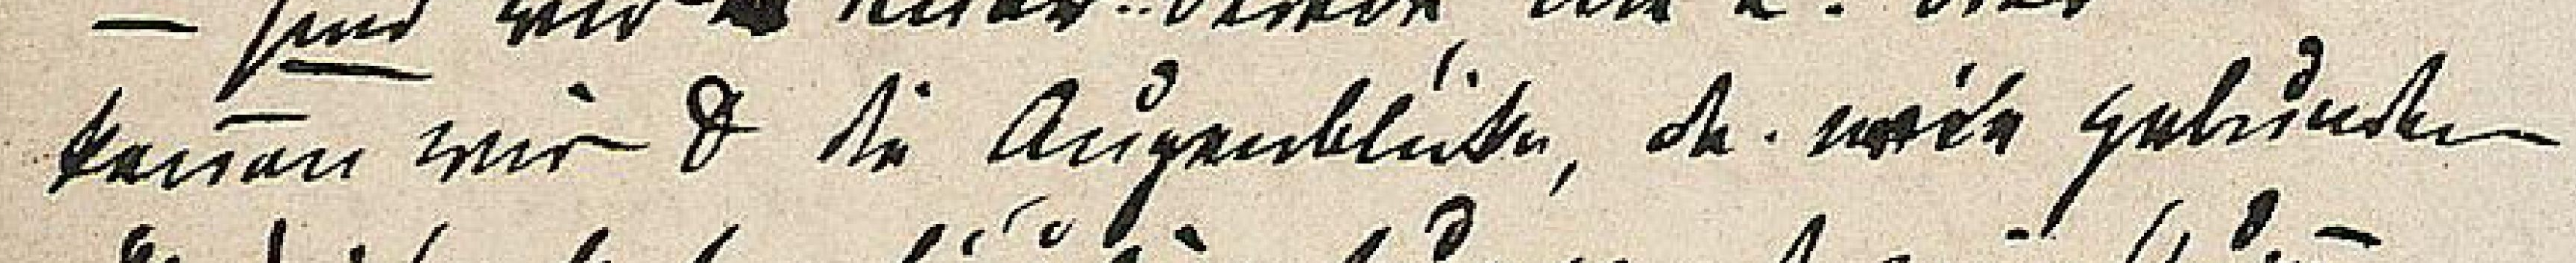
kennen wir o die Augenblicke, da wir gebunden
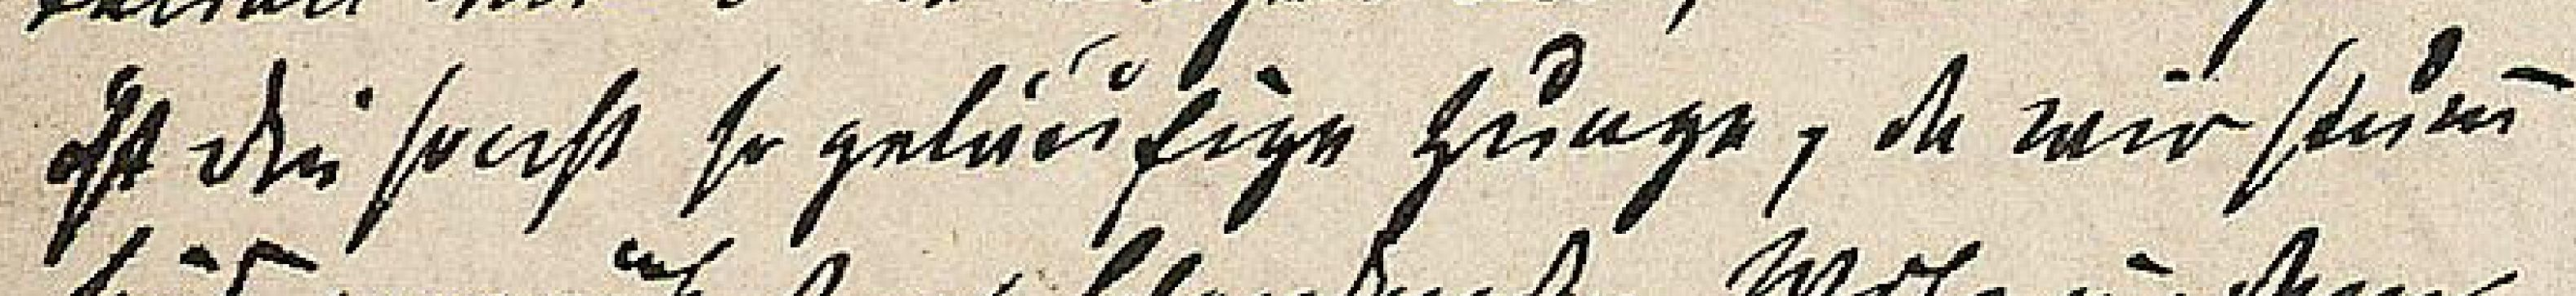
ist die sonst so geläufige Zunge, da wir stum
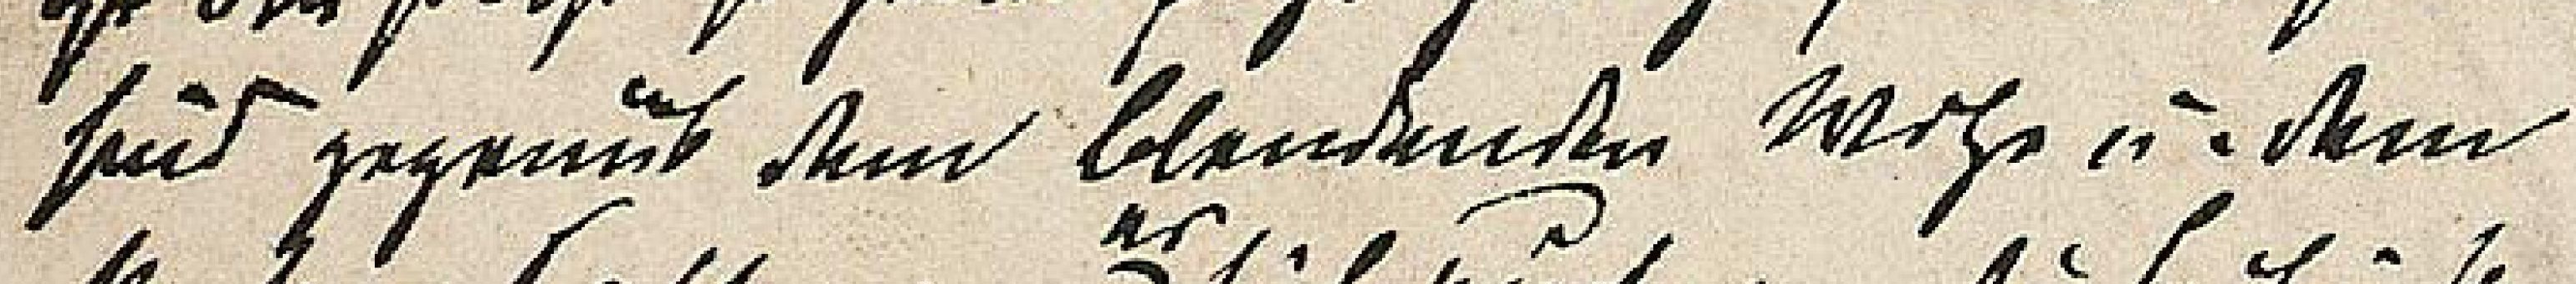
sind gegenüb dem blenden Witze u. dem
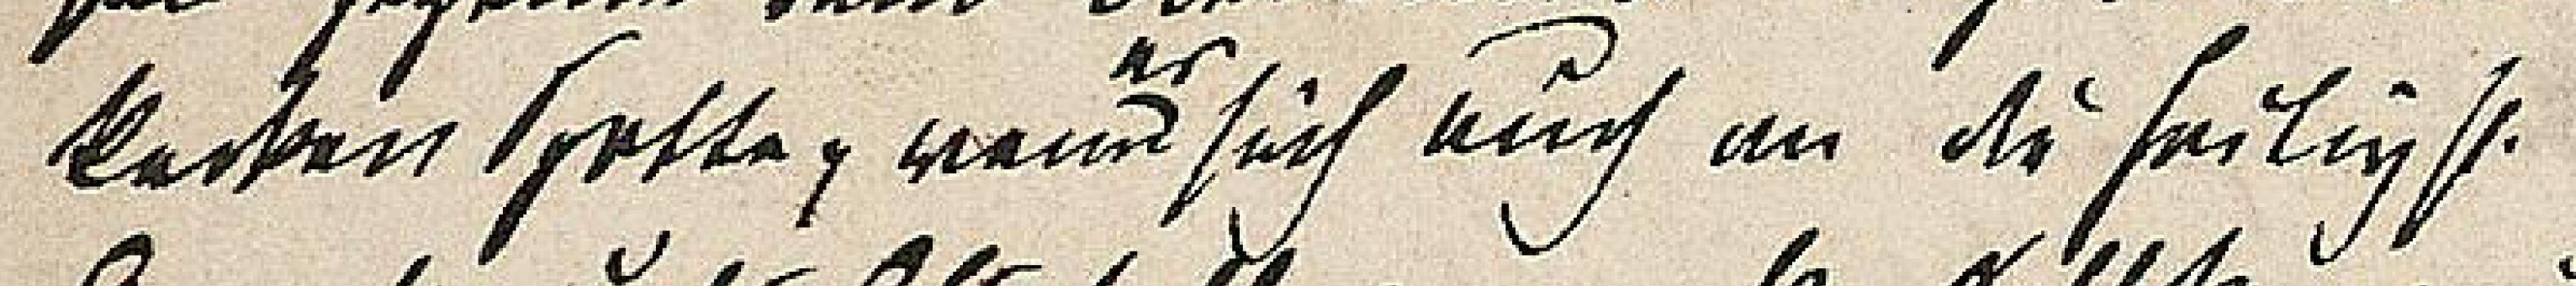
karken Spotte, wenn es sich euch an die heiligste
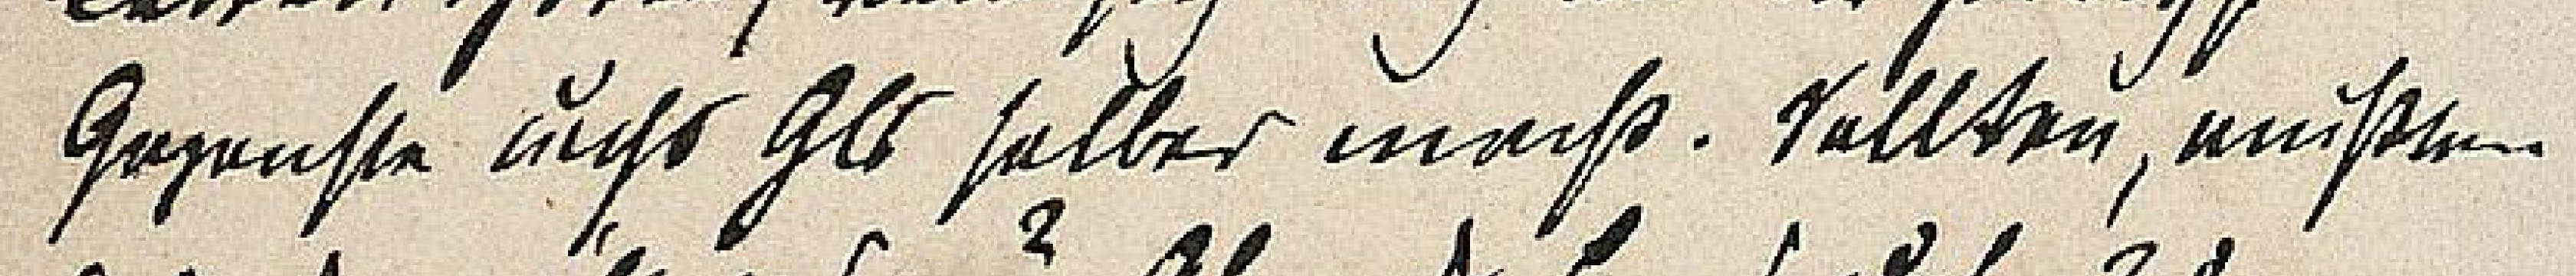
Gegenste unss Gls selber macht. Sollten, müßten
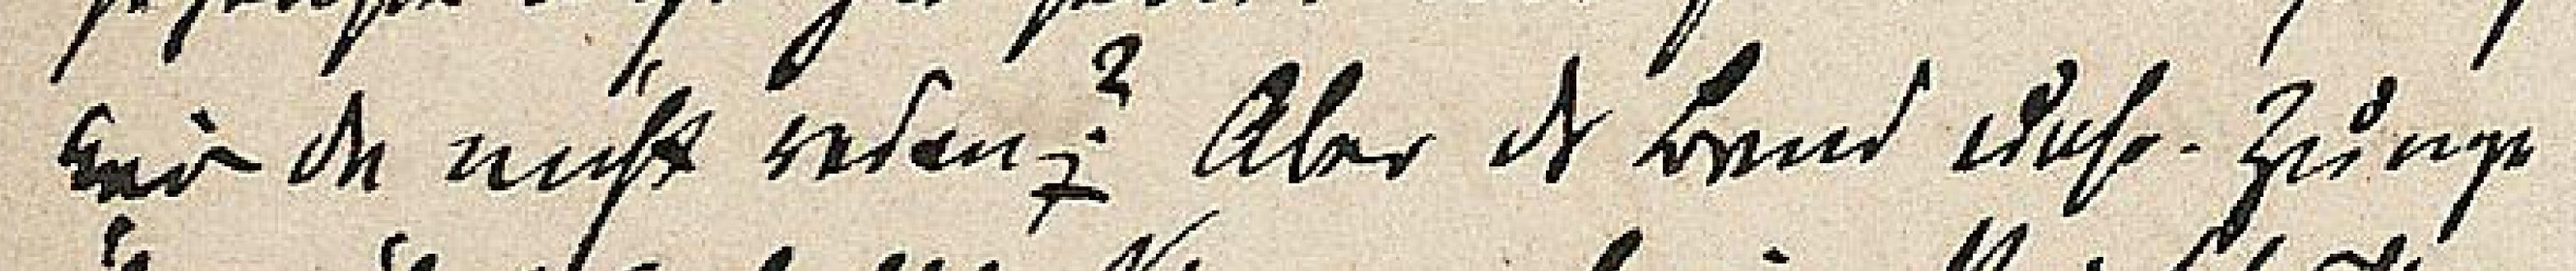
wir da nicht reden? Aber ds Band unsr. Zunge
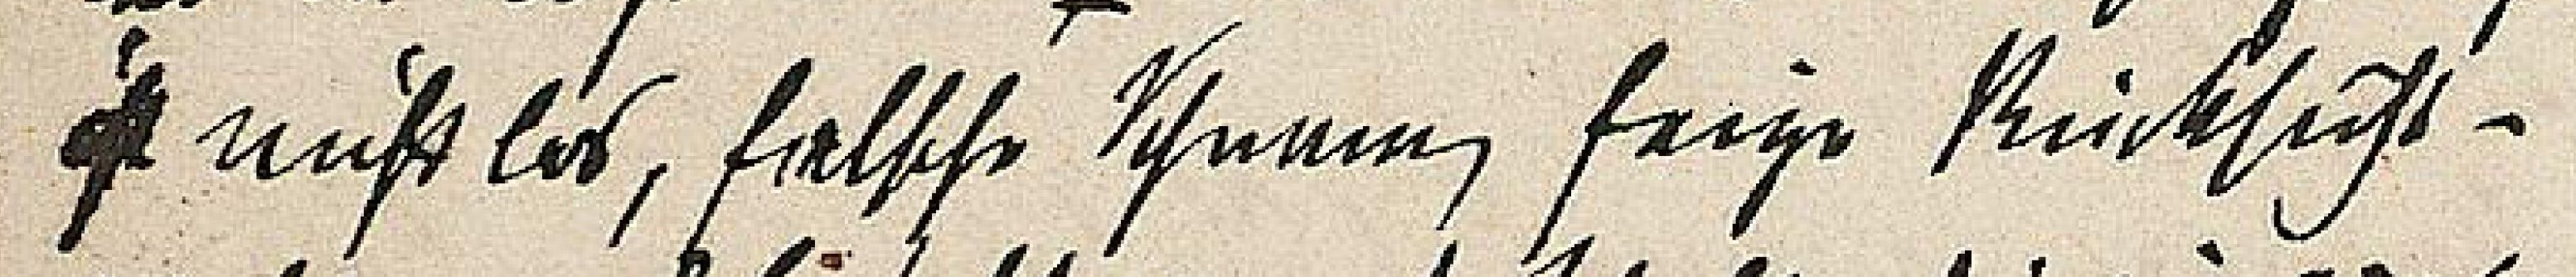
ist nicht los, falsche Schaam, feige Rücksicht¬
